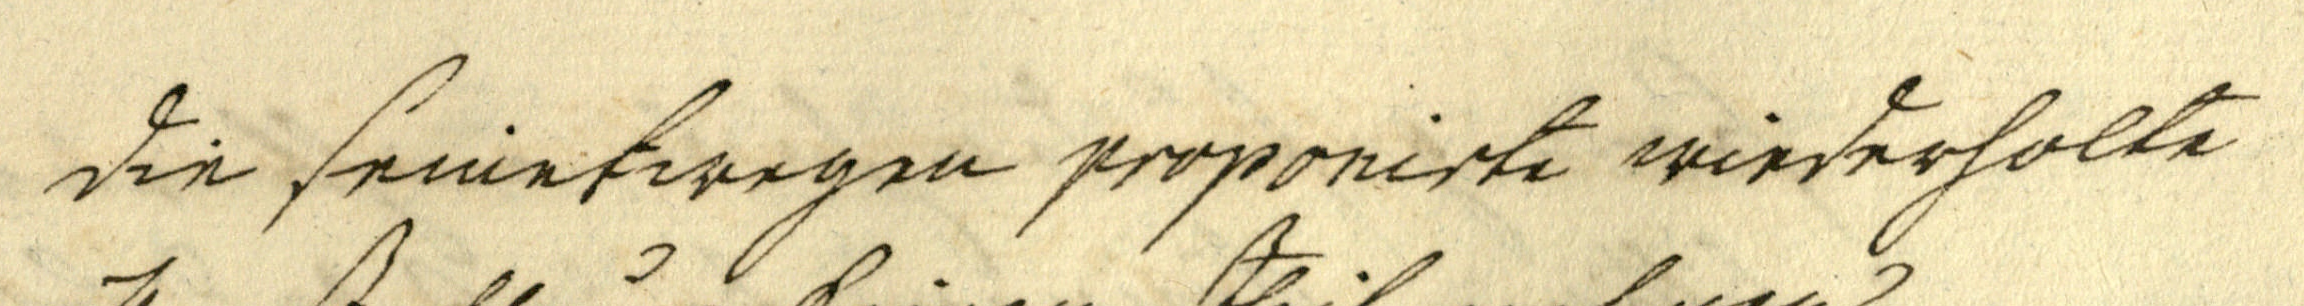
die seinetwegen proponirte wiederholte
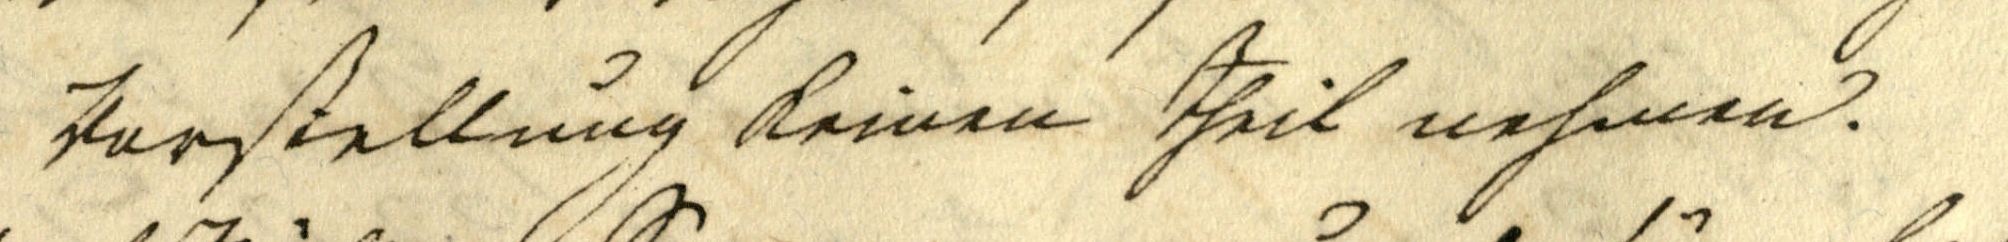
Vorstellung keinen Theil nehmen.
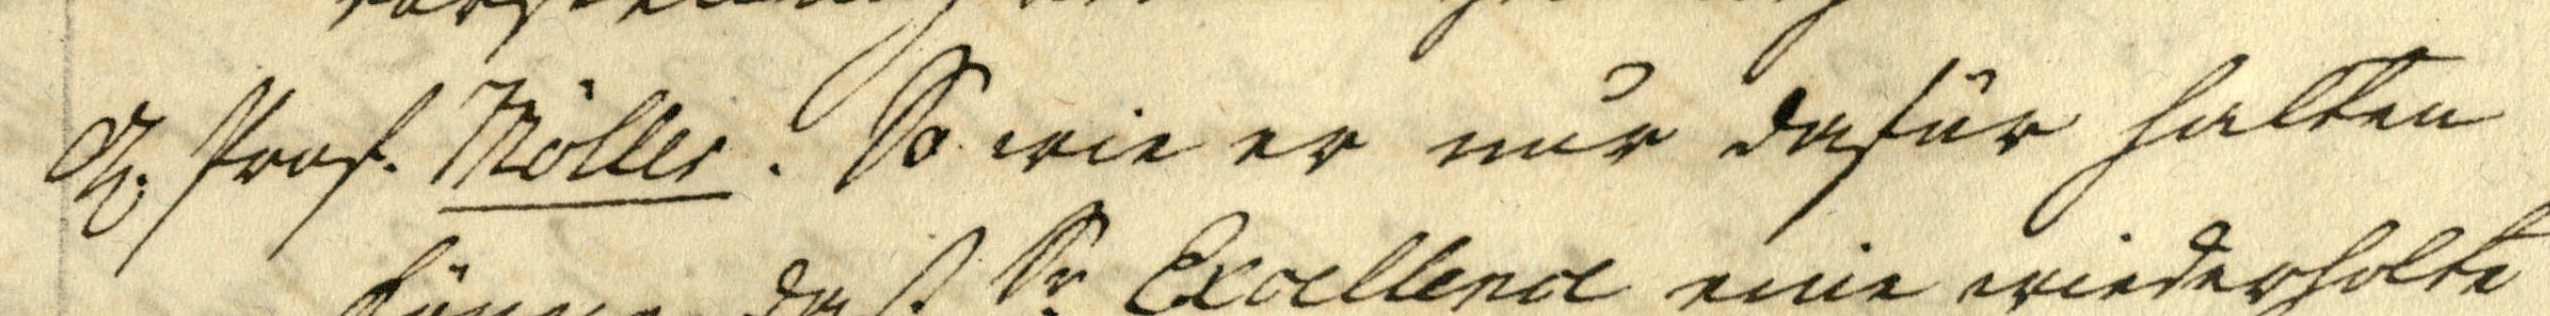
dh. Prof. Möller. So wie er nur dafür halten
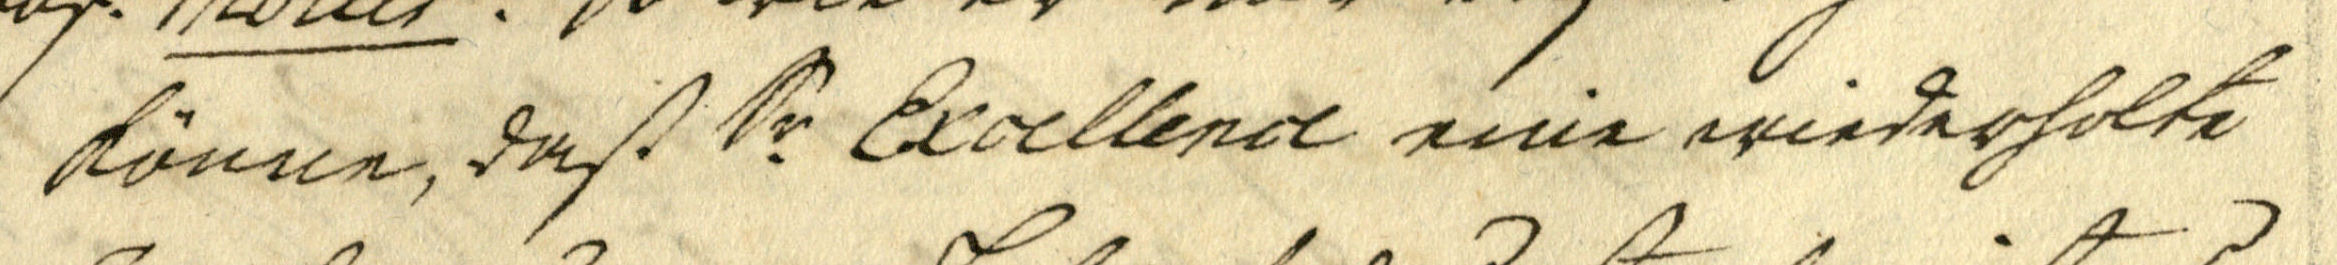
könne, daß Sr Excellence eine wiederholte
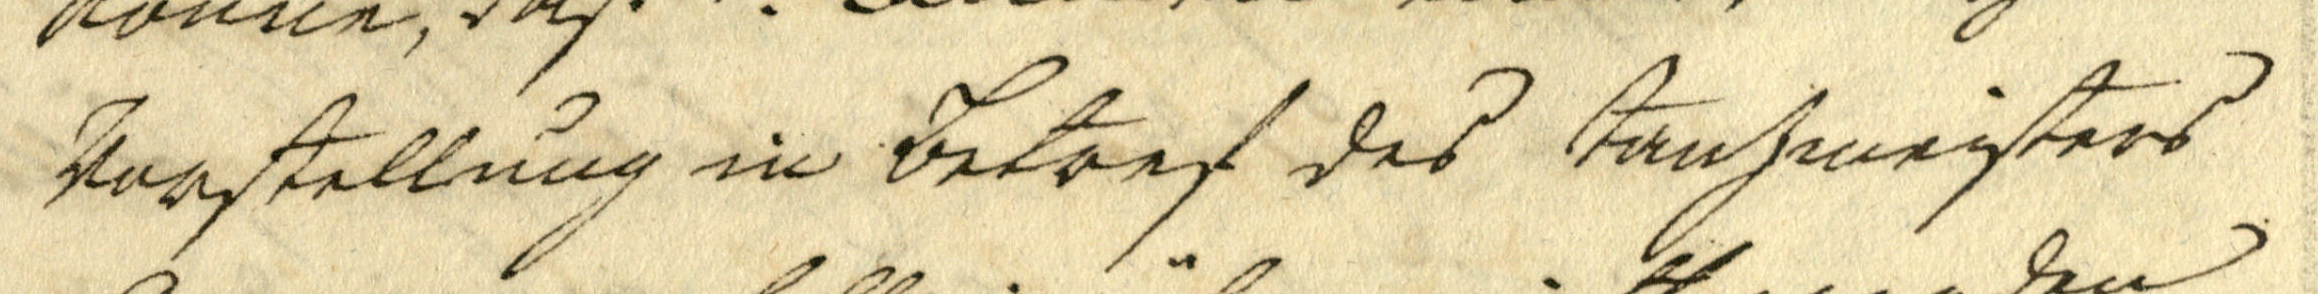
Vorstellung in Betref des Tanzmeisters
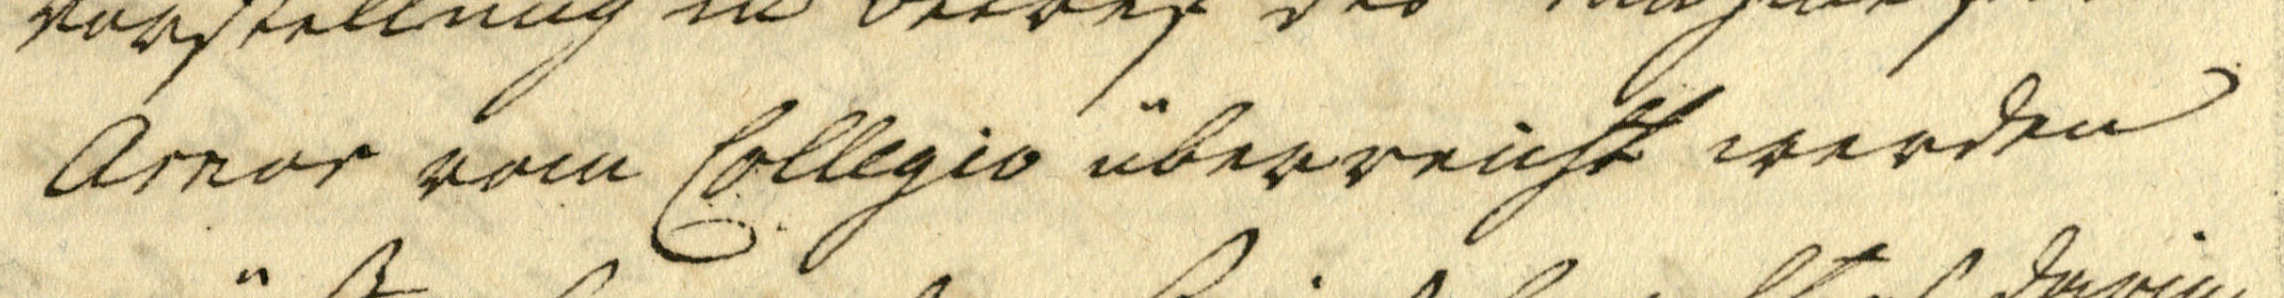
Amor vom Collegio überreicht werden
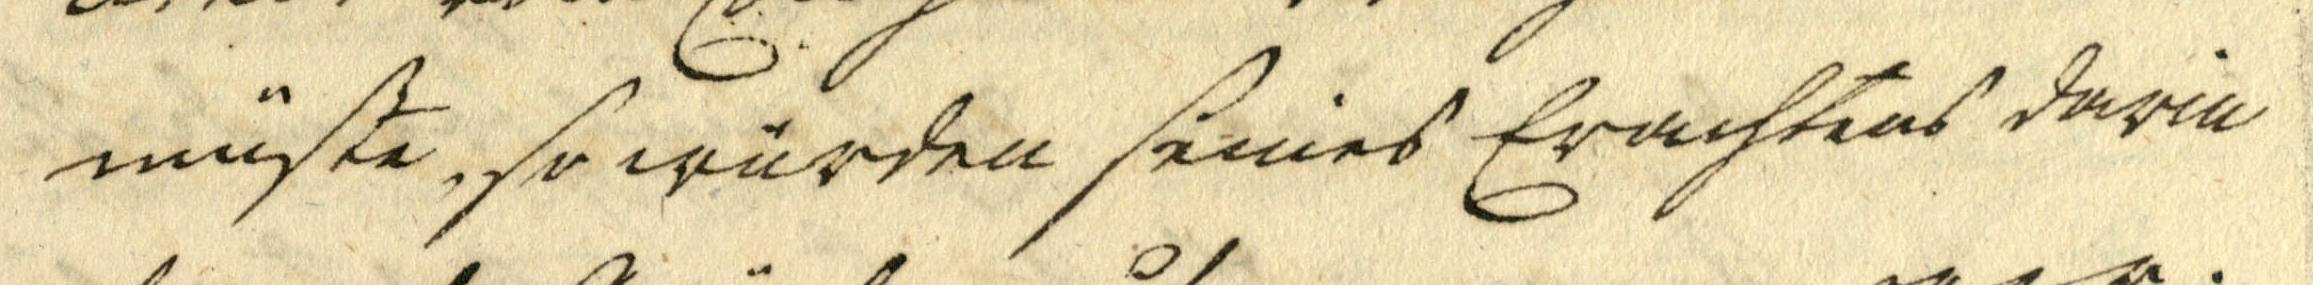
müßte, so würden seines Erachtens darin
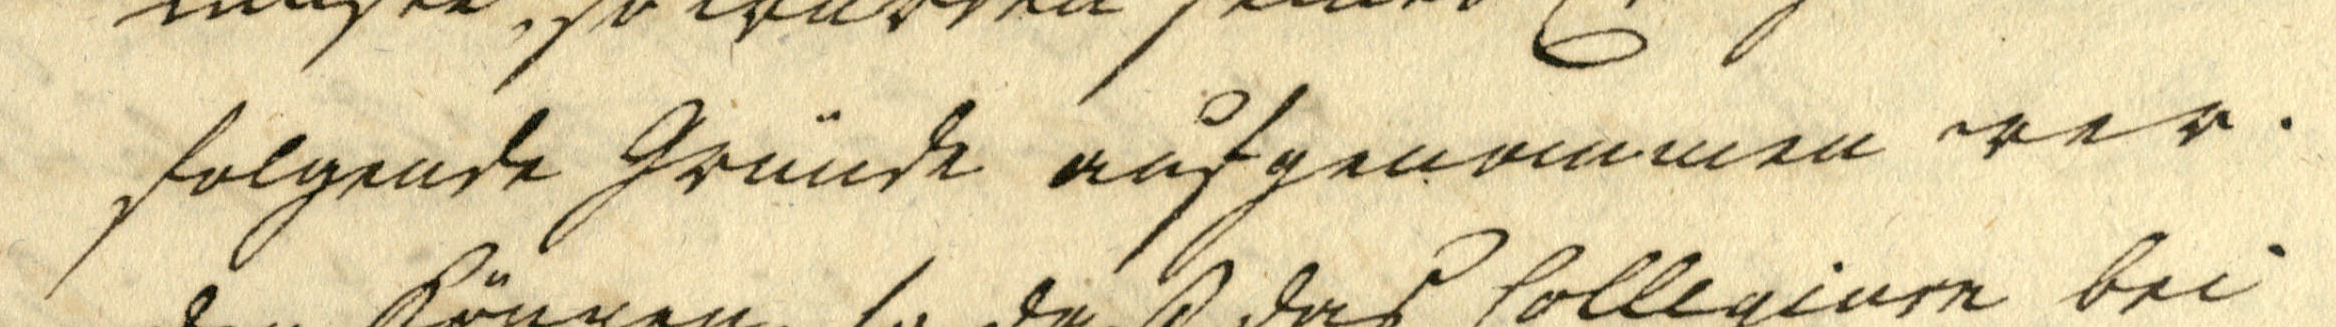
folgende Gründe aufgenommen wer¬
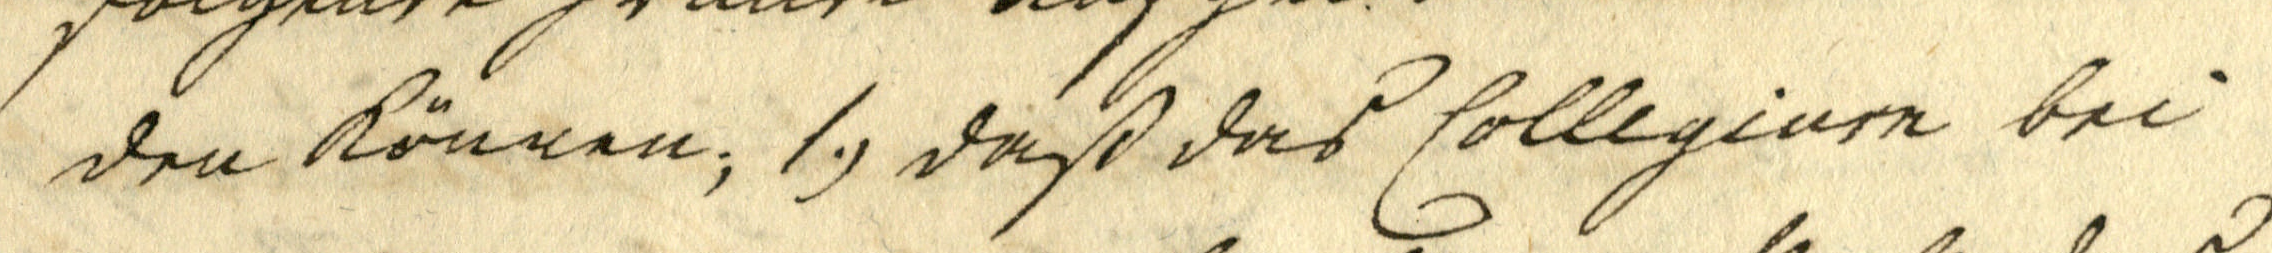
den können; 1., daß das Collegium bei
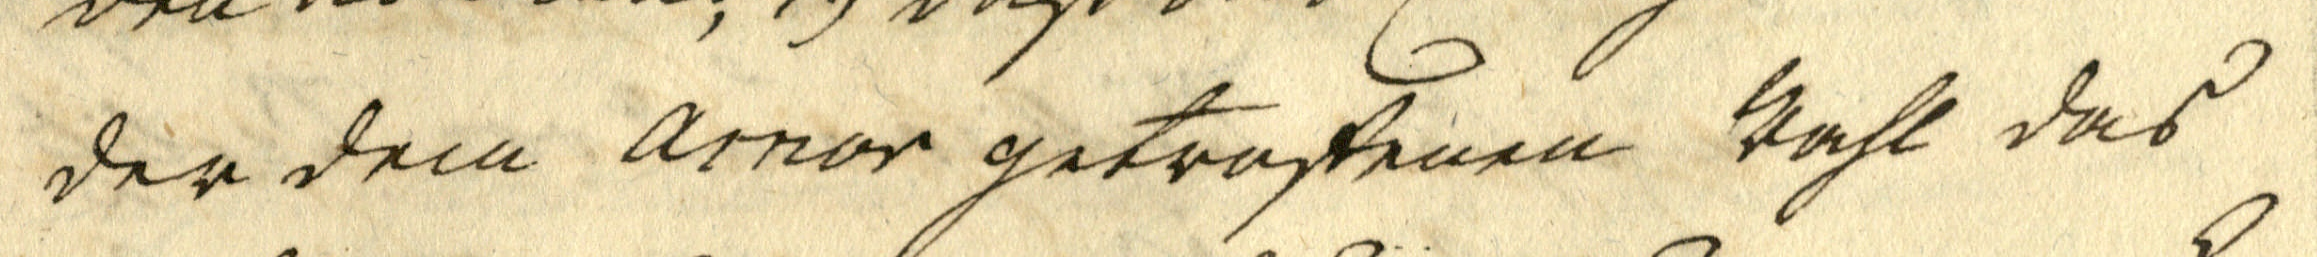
der dem Amor getroffenen Wahl das
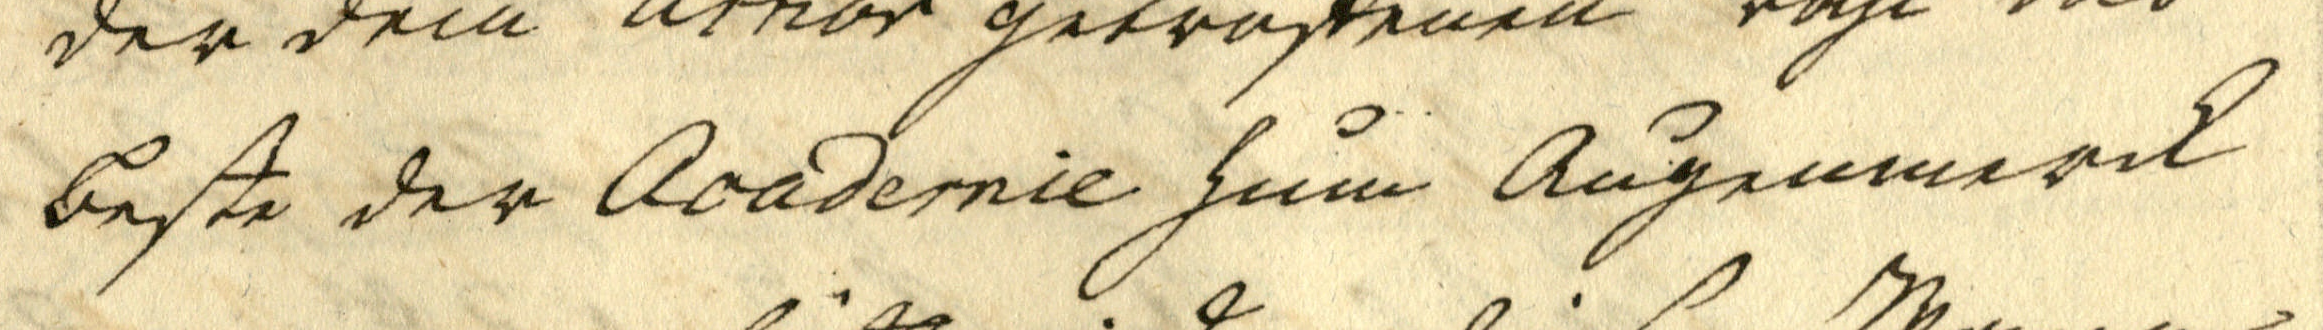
Beste der Academie zum Augenmerck
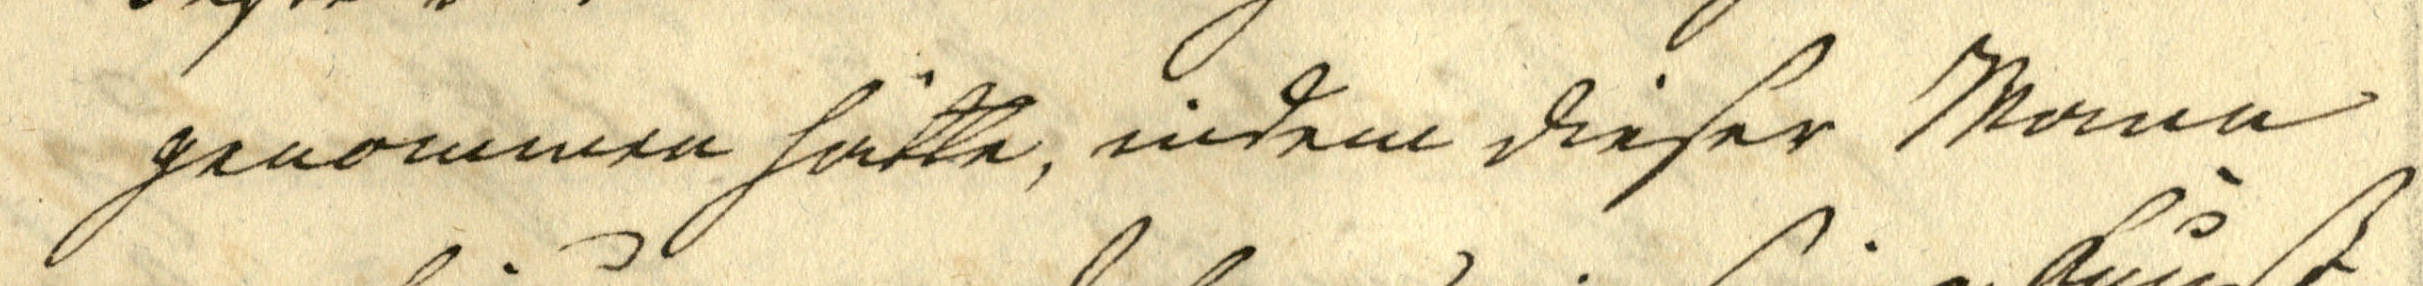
genommen hätte, indem dieser Mann
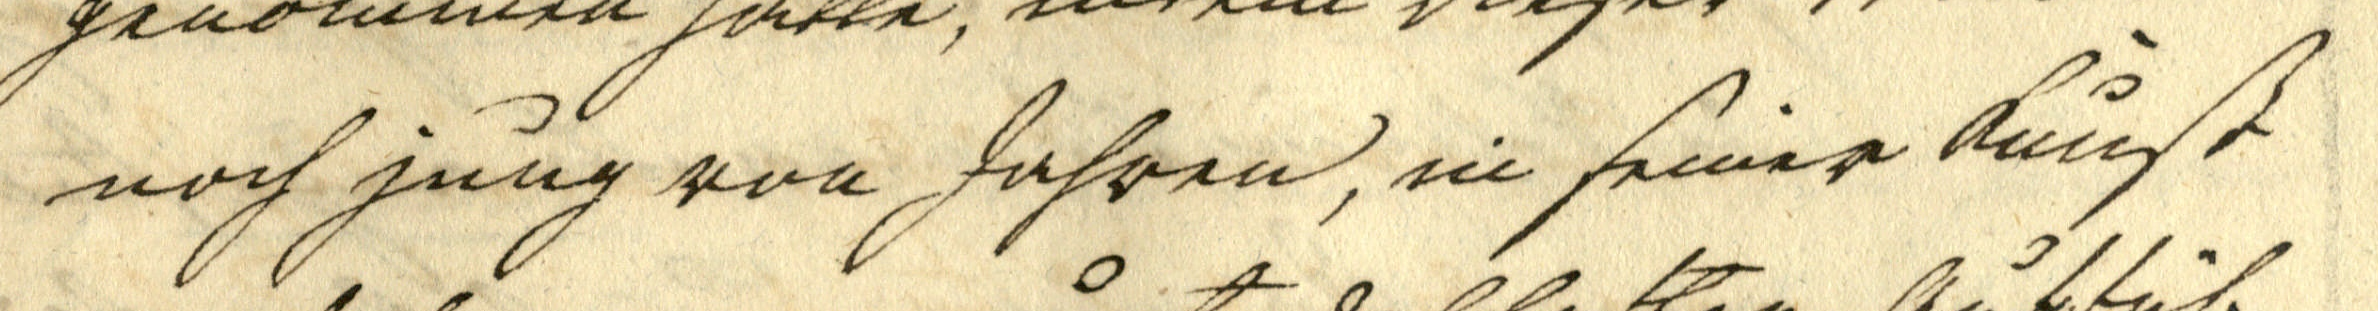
noch jung von Jahren, in seiner Kunst
